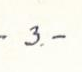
3
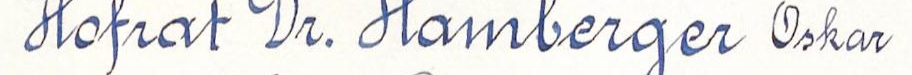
Hofrat Dr. Hamberger Oskar
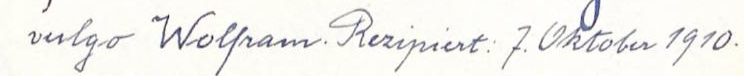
vulgo Wolfram. Rezipiert: 7. Oktober 1910.
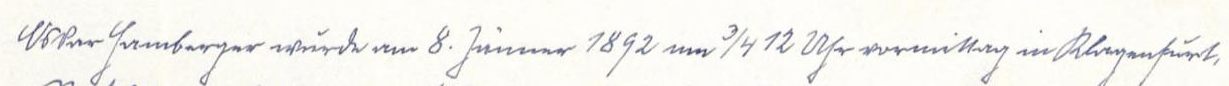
Oskar Hamberger wurde am 8. Jänner 1892 um ¾ 12 Uhr Vormittag in Klagenfurt,
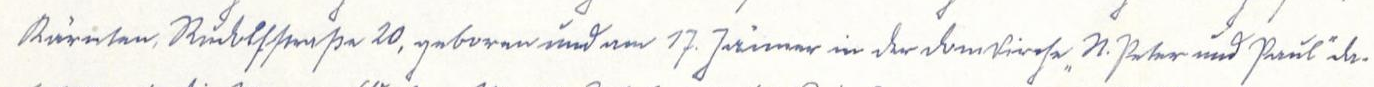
Kärnten, Rudolfstraße 20, geboren und am 17. Jänner in der Domkirche St. Peter und Paul da-
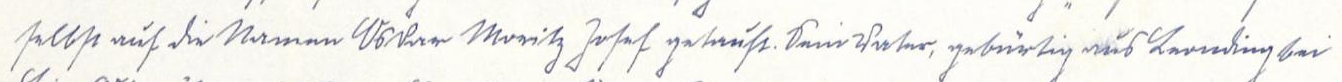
selbst auf die Namen Oaskar Moritz Joseph getauft. Sein Vater, gebürtig aus Leonding bei
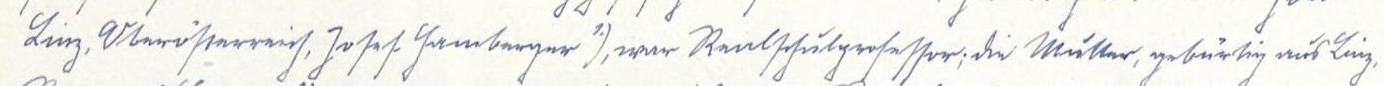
Linz, Oberösterreich, Joseph Hamberger 1), war Realschulprofessor, die Mutter, gebürtig aus Linz,
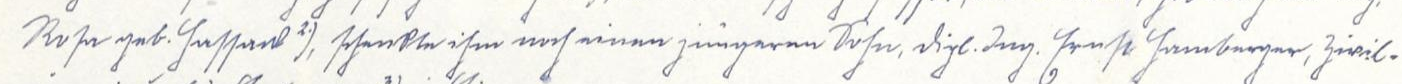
Rosa geb. Hassak 2) schenkte ihm noch einen jüngeren Sohn, Dipl. Ing. Ernst Hamberger, Zivil-
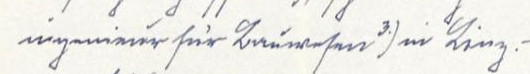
ingenieur für Bauwesen 3) in Linz.
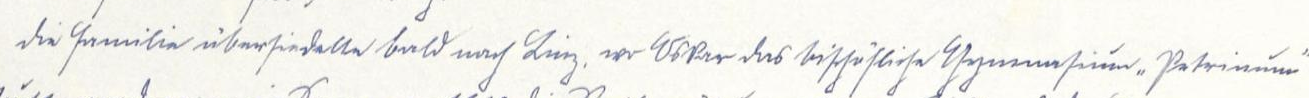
Die Familie übesiedelte bald nach Linz, wo Oskar das bischöfliche Gymnasium „Petrinum“
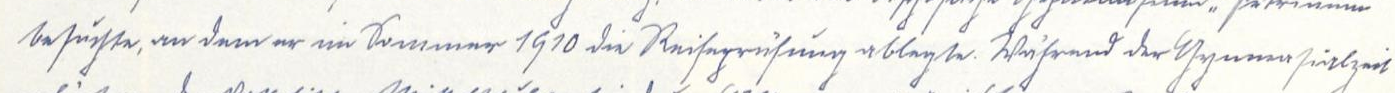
besuchte, an dem er im Sommer 1910 die Reifeprüfung ablegte. Während der Gymnasialzeit
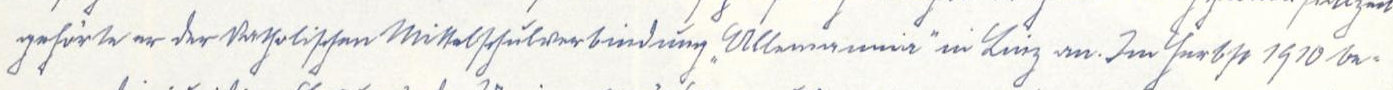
gehörte er der katholischen Mittelschulverbindung „Allemannia“ in Linz an. Im Herbst 1910 be-
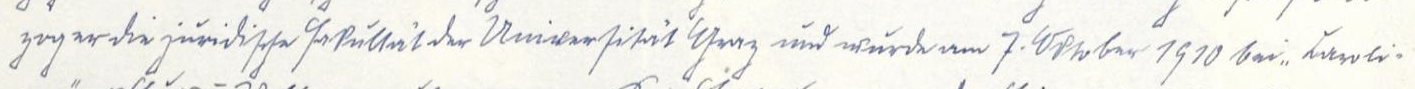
zog er die juridische Fakultät der Universität Graz und wurde am 7. Oktober 1910 bei „Caroli-
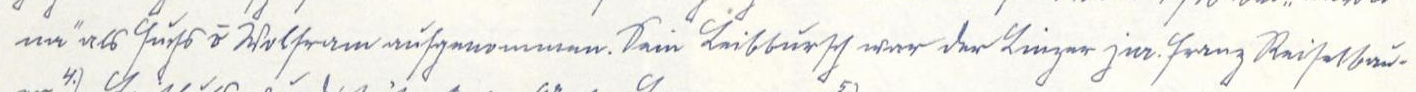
na als Fuchs v/o Wolfram aufgenommen. Sein Leibbursch war der Linzer jur. Franz Reiselbau-
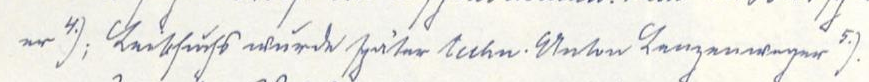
er 4), Leibfuchs wurde später techn. Anton Lenzenweger 5)
